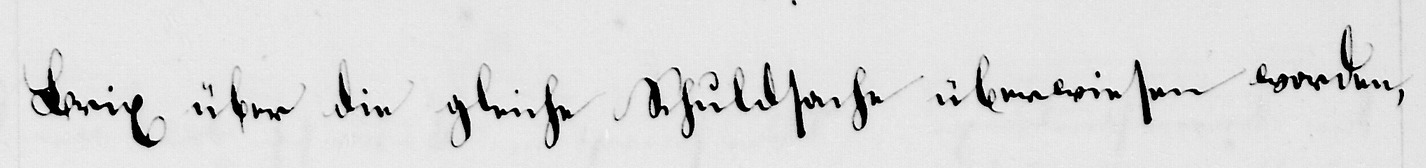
Brix über die gleiche Schuldsache überwiesen worden,
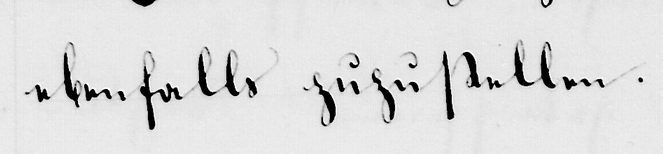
ebenfalls zuzustellen.
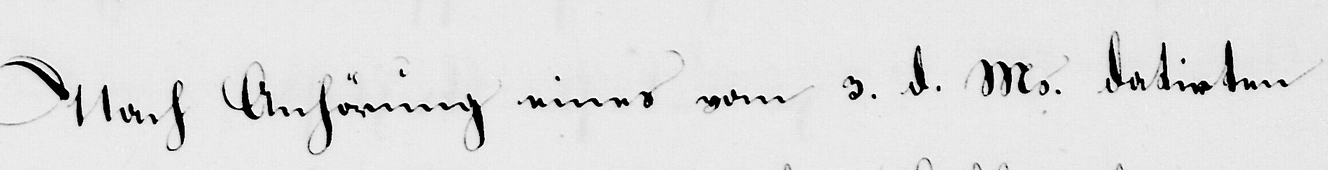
Nach Anhörung eines vom 3. d. Ms. datirten
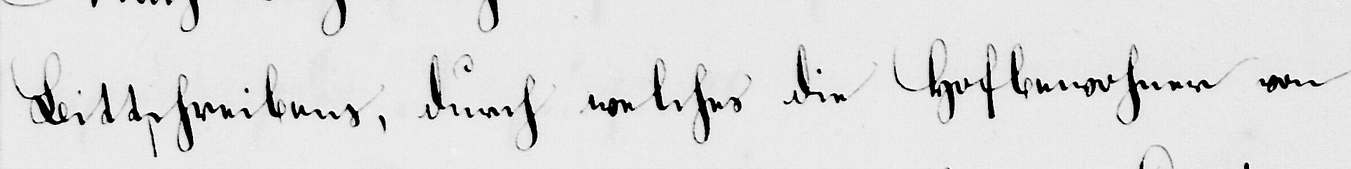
Bittschreibens, durch welches die Hofbewohner von
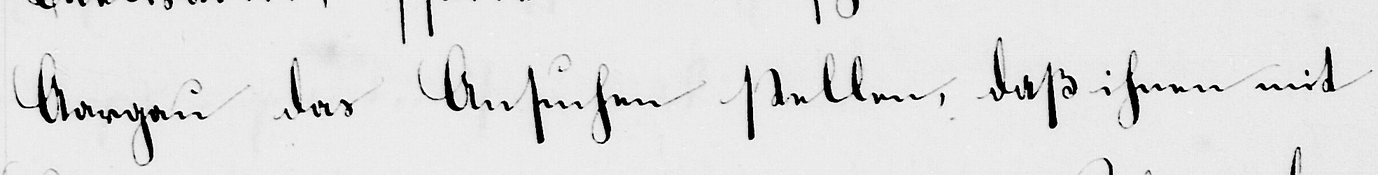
Aargau das Ansuchen stellen, daß ihnen mit
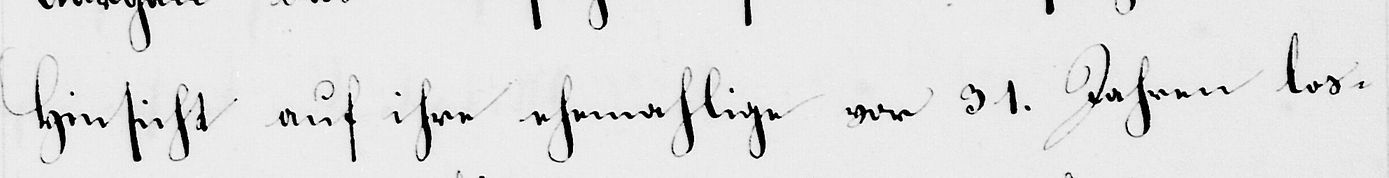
Hinsicht auf ihre ehemahlige vor 31. Jahren los¬
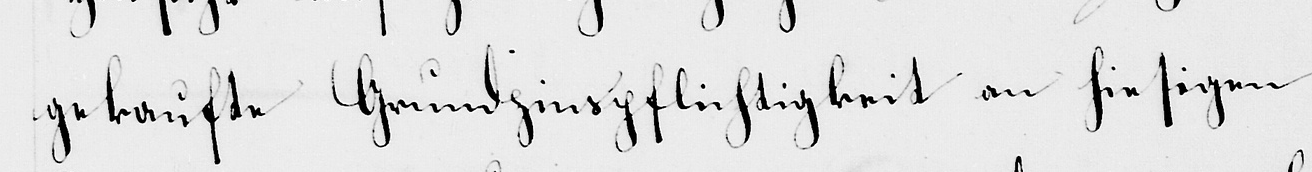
gekaufte Grundzinspflichtigkeit an hiesigen
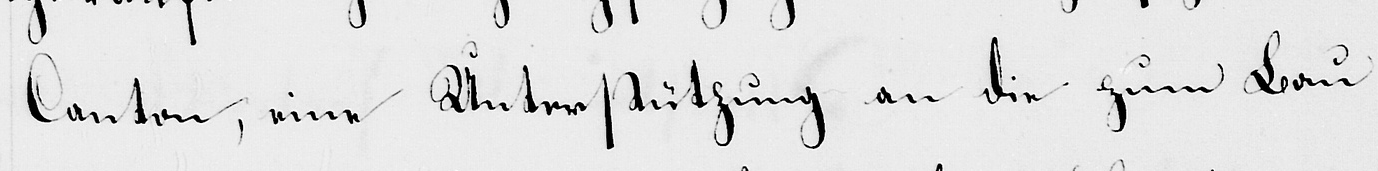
Canton, eine Unterstützung an die zum Bau
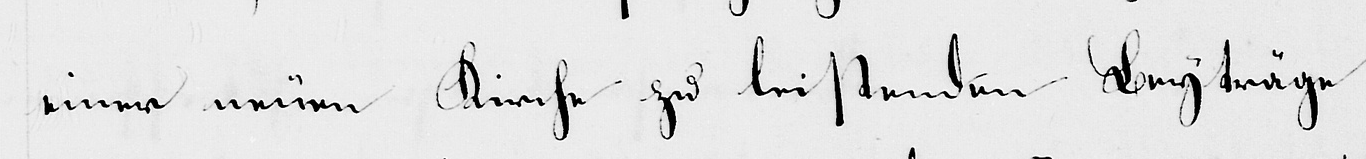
einer neuen Kirche zu leistenden Beyträge
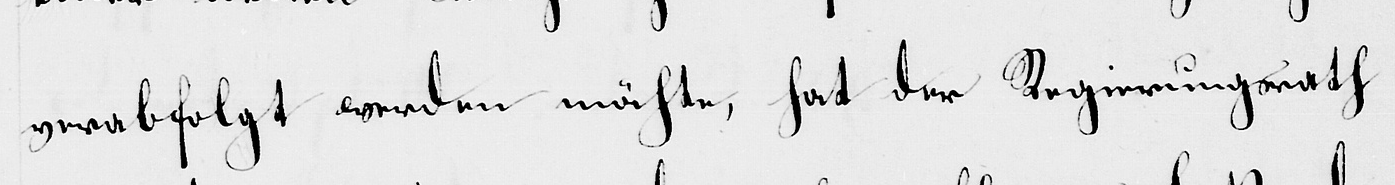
verabfolgt werden möchte, hat der Regierungsrath
